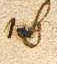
18
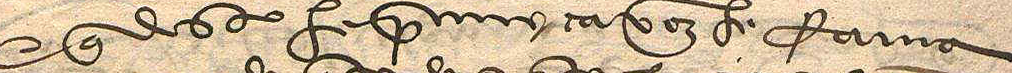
e q̄ desto he p̄uuyca voz he fama
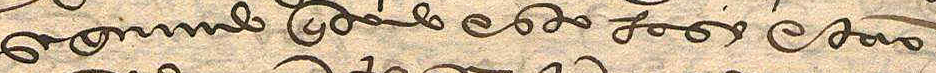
segumdo q̄ todo esto hasy e tão
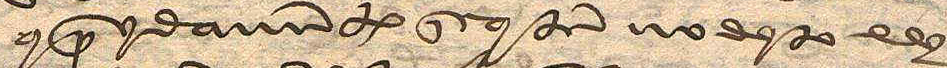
ꝯp̄ydamētꝭ se ꝯtē no dyto lly
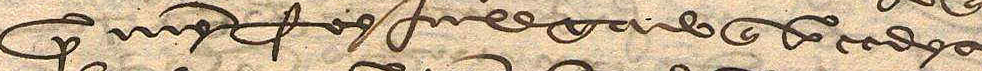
p̄o mȳ foy Jullgado q̄ p̄ocedya
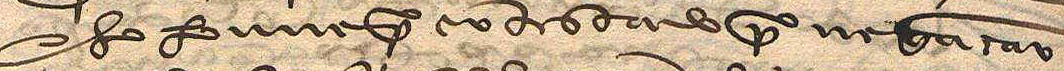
e ho houue p̄o cōtestado p̄o negação
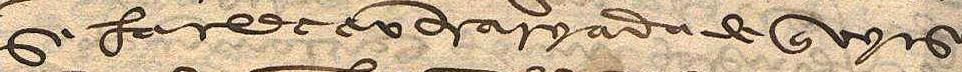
se ha elle cōtraryadade q̄ vyese
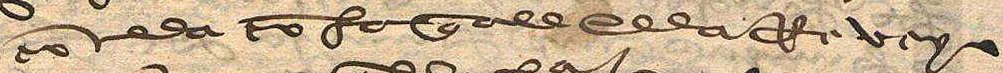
cō ella c̄o ha q̄all ella Re veyo
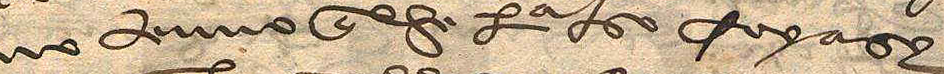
no termo q̄ lhe ꝑa Jso foy asy
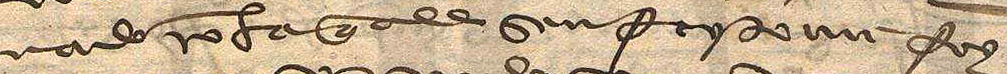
nado c̄o ha q̄all seu feyto me foy
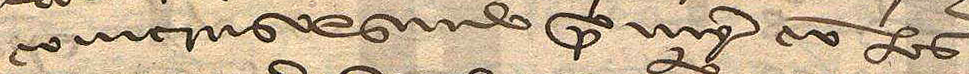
comcruso e sendo p̄o mȳ cō hos
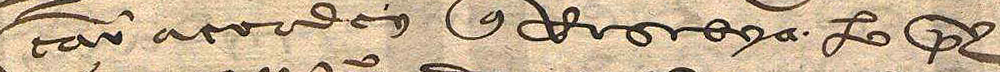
ção acordey q̄ Resebya ho p̄y
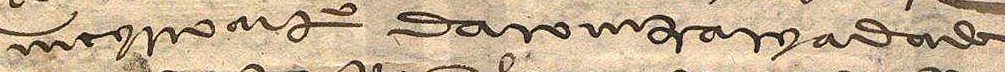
meyrro arto da comtraryadade
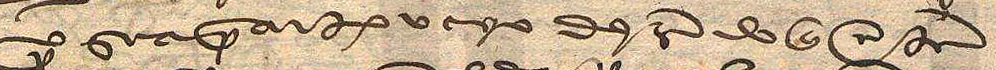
p̄o sua p̄artꝭ veyo dyzēdo q̄ ētē
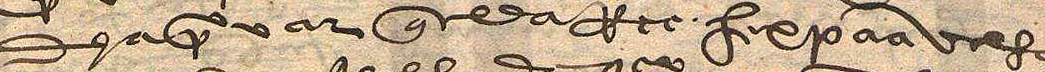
dya p̄ovar q̄ ella Ree he xpāa velha
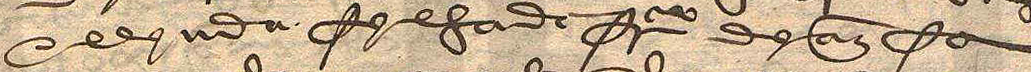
e llynda fylha de frco dyaz fa
